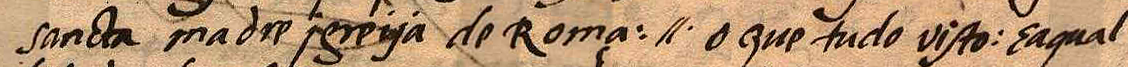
sancta madre jgreja de Roma //. o Que tudo visto E a qual
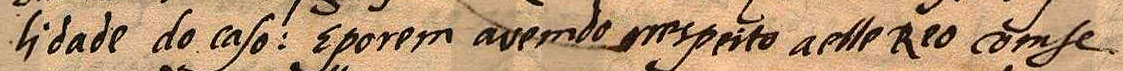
lidade do caso E porem avemdo o respeito a elle Reo comfe
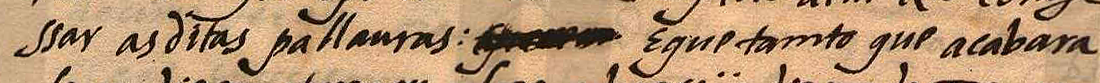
ssar as ditas pallavras _ E que tamto que acabara
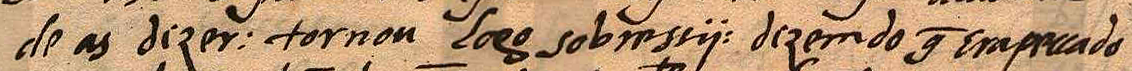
de as dizer tornou logo sobre ssij dizemdo q̄ Era peccado
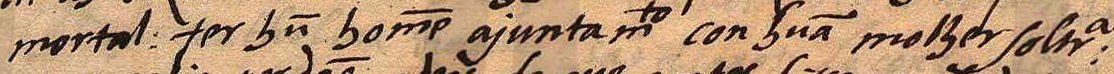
mortal ter hū hom̄e ajuntamto con huā molher soltra
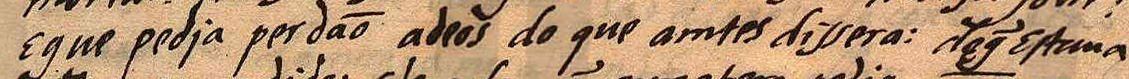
E que pedja perdão a deos do que amtes dissera de q̄ Estaua
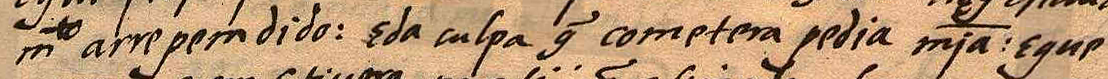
mto arrepemdido E da culpa q̄ cometera pedia m̄ja E que
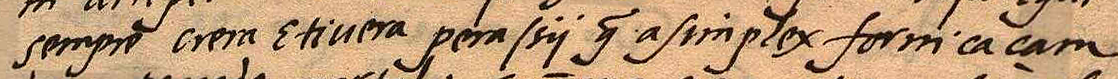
sempre crera E tiuera pera / sij q̄ a simplex fornicaçam
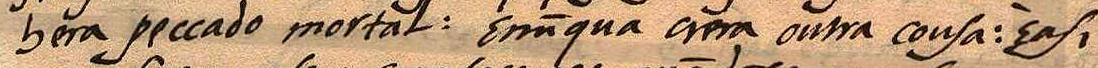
hera peccado mortaL E nūqua crera outra cousa E asi
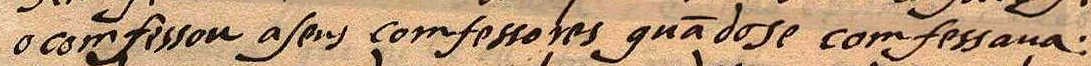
o comfessou a seus comfessores quādo se comfessaua
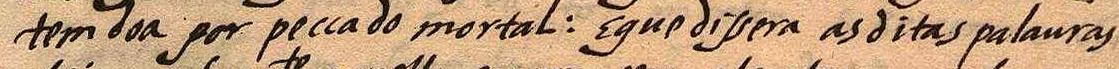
temdoa por peccado mortaL E que dissera as ditas palauras
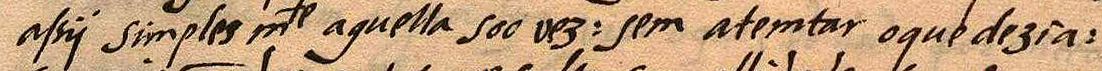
assij simplesmte aquella soo vez sem atemtar o que dezia
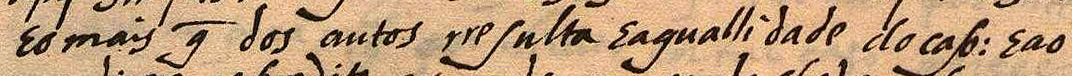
E o mais q̄ dos autos rresulta E a quallidade do caso E ao
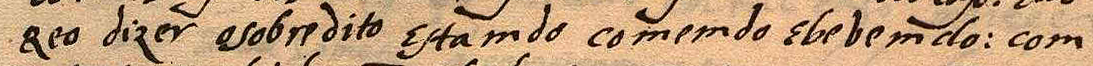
Reo dizer o sobredito Estamdo comemdo E bebemdo com
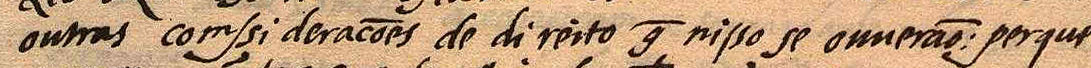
outras comssiderações de direito q̄ nisso se ouuerão per que
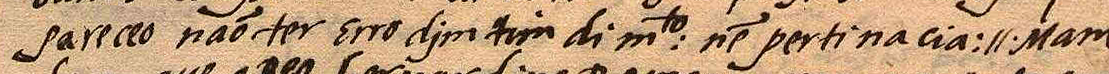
pareceo naõ ter Erro djmtimdimto nē pertinacia //. Mam
